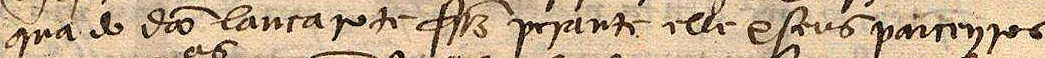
qua do dito lancarote frr̄z perante ell e seus parceyros
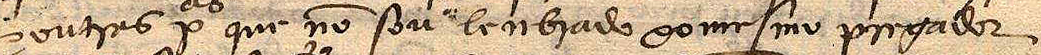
e outras pas que n̄o sou lenbrado e o mesmo pregador
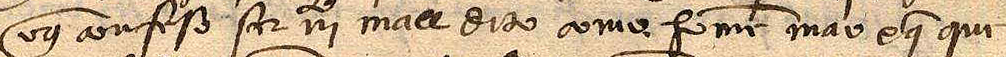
o q̄ confeso ser mto mall dito como hōme mao e q̄ que
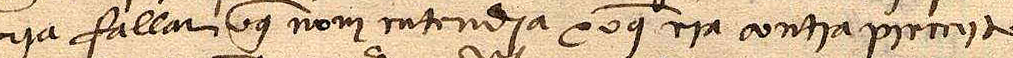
rja fallar o q̄ nom entendja e o q̄ era contra preceyto
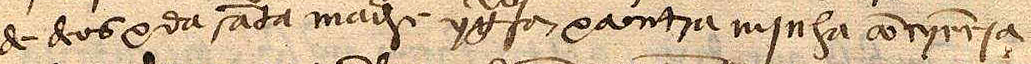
de deos e da sāta madre yḡJa e contra mjnha c̄ocyēcja
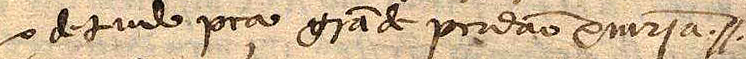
e de tudo peço grāde perdão e mr̄ja . //.
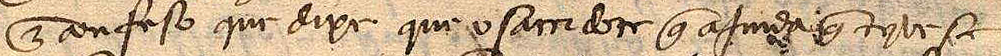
item confeso que dixe que o sacerdote q̄ aJmda q̄ tyvese
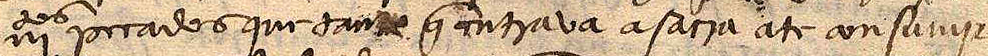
mtos pecados q̄ tanto q̄ entrava a sacra ate consumjr
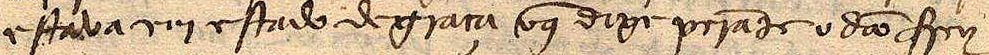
estava em estado de graça o q̄ dixe per̄ate o dc̄o frey
